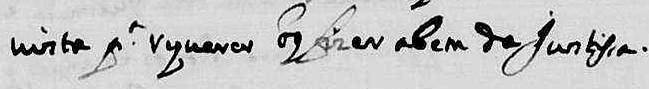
uista p.a requerer o q̄ fizer a bem da Justissa.
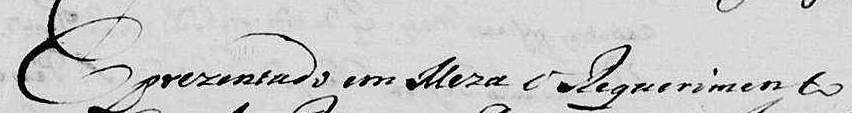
E prezentado em Meza o Requerimento
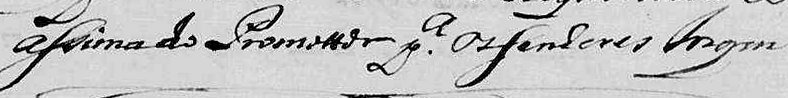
assima do Promottor p.a os senhores Inqui
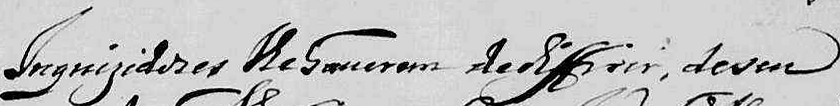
Inquizidores lhe hauerem de differir, de seu
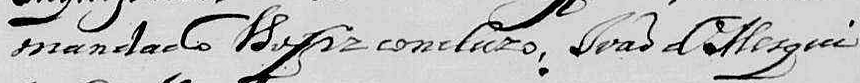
mandado lho fiz concluzo, Ioaõ de Mesqui
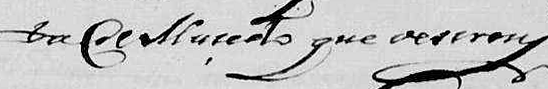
ta de Macedo que o escreuj
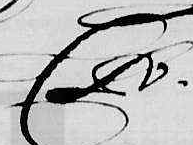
CLo.
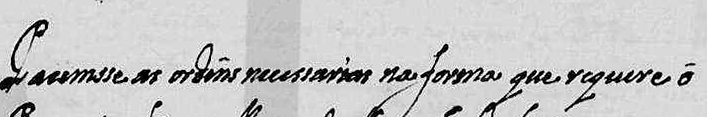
Pacemsse as ordens necessarias na forma que requere o
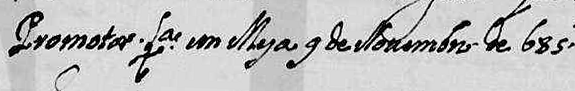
Promotor. Lx.a em Meza 9 de Nouembro de 685.
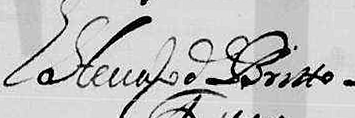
ESteuaõ de Britto
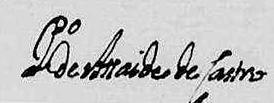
Po de Attaide de Castro
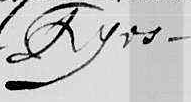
Foyos -
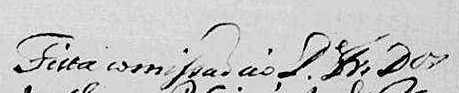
Feita comissaõ ao P.e Fr. Dos
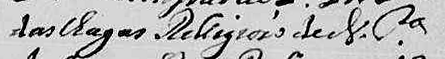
das Chagas Relligiozo de N. s.ra
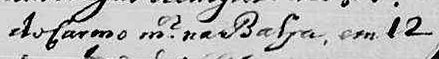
do Carmo mor. na Bahja, em i2
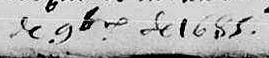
de 9br.o de 1685.
